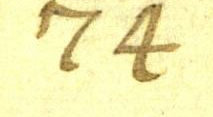74
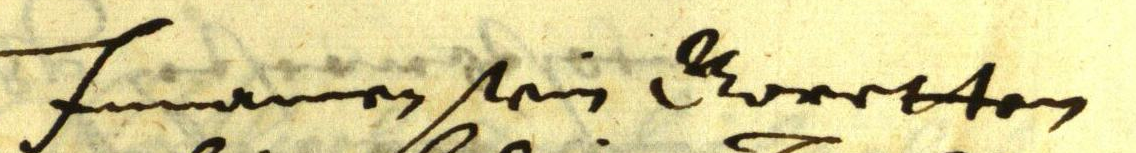Innamen sein Goretten
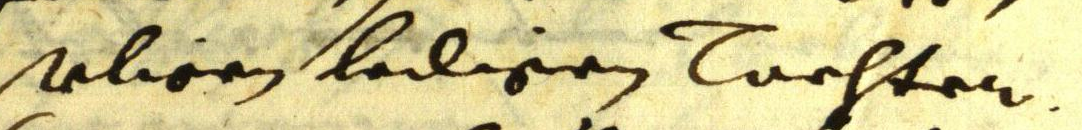seligen ledigen Tochter
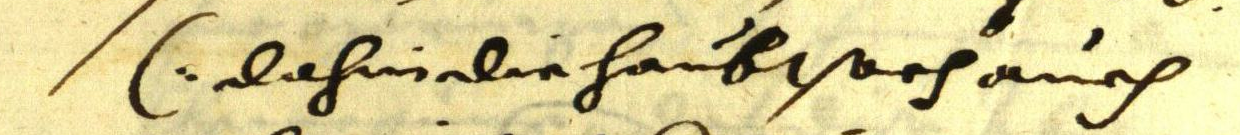(: dahin die haūbtsach aūch
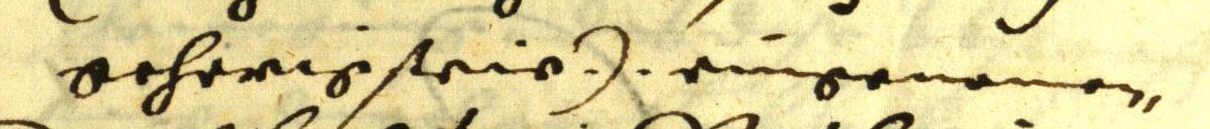Geherig seie.). eingenomen.
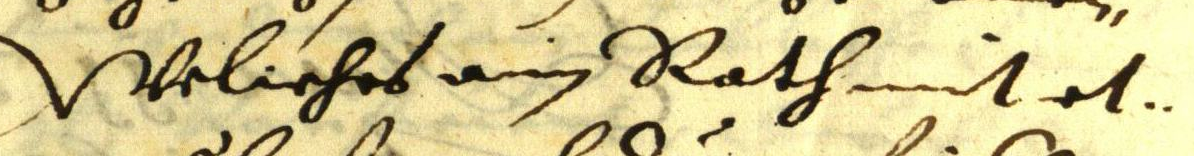Weiliches aim Rath mit et¬
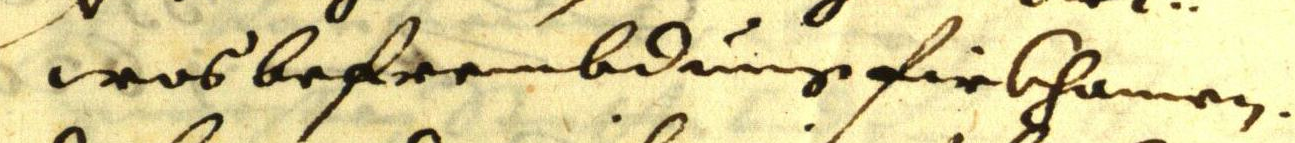was befrembdūng fir khomen.
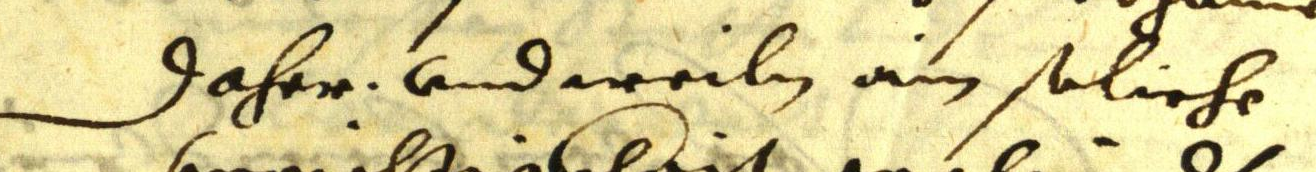Daher vnd weiln ain soliche
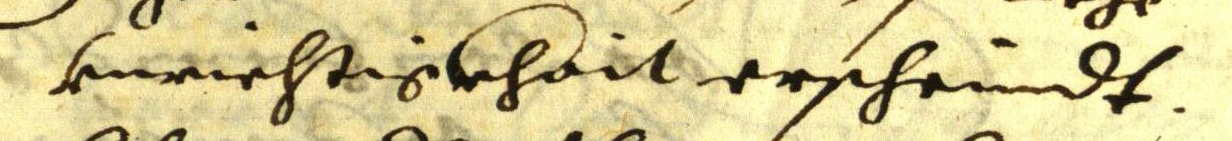Unrichtig khait erscheindt,
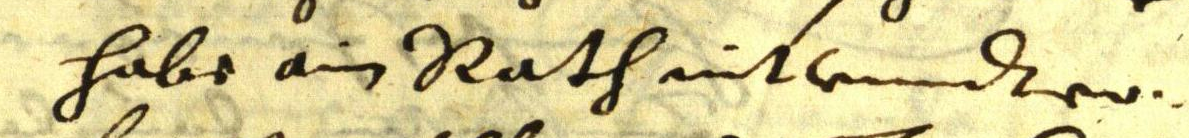Habe ain Rath nit vndter¬
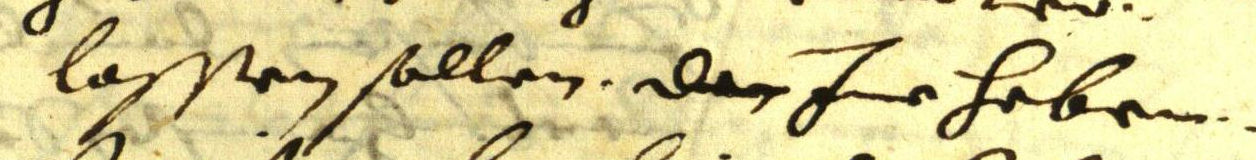lassen sollen den Ime Heben¬
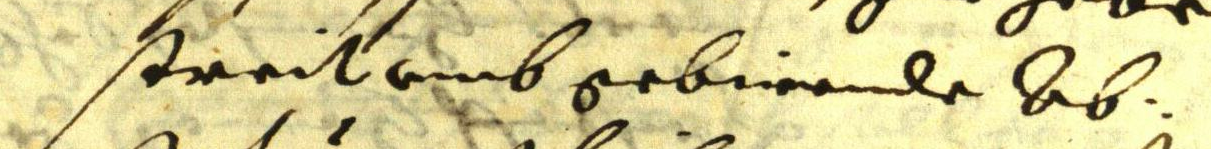streit umb gebieende Ab¬
